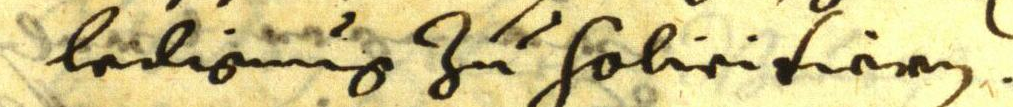ledigūng Zū solicitern.
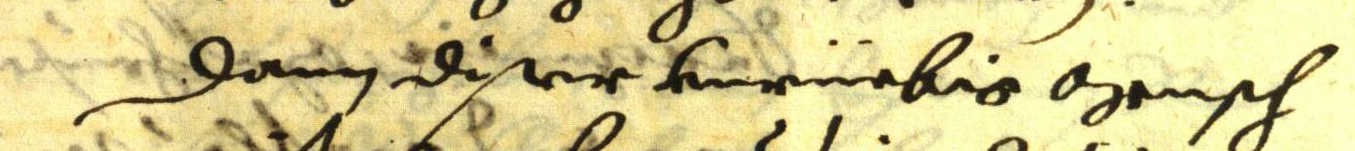dann diser vnrüebig Mensch
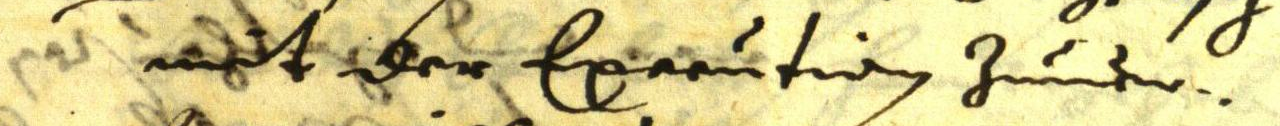mit der Execūtion Zūūer¬
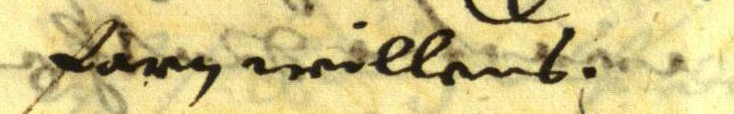farn willens.
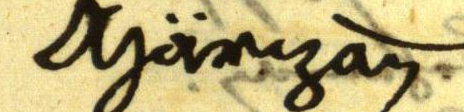Märzän
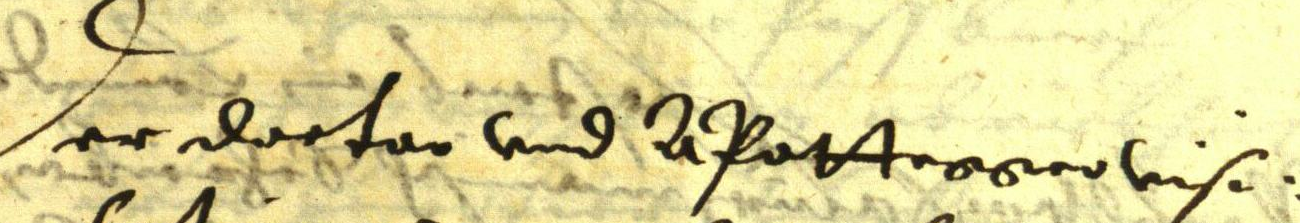Der doctor vnd APottegger visi¬
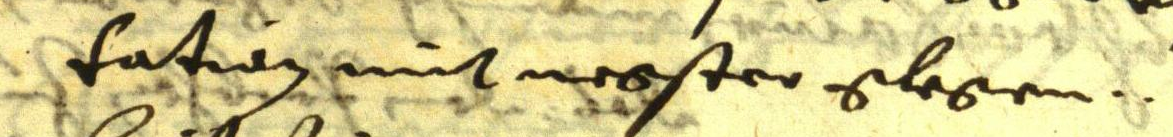tation mit negster glegen¬
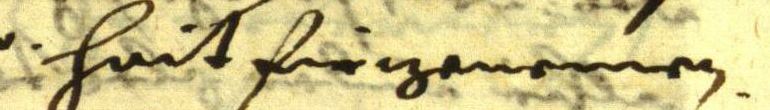hait firzenemen.
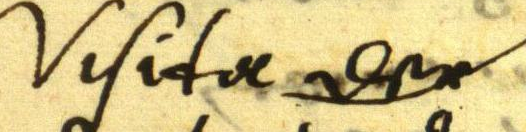Visita der
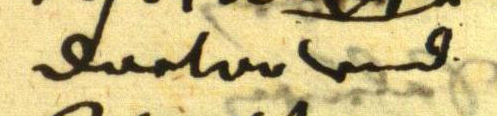doctor vnd
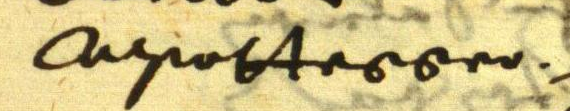Apottegger.
